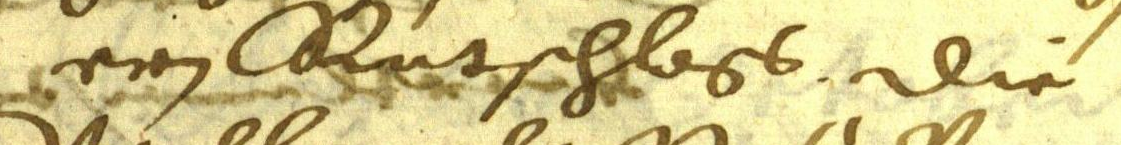ern Ratschlags. die
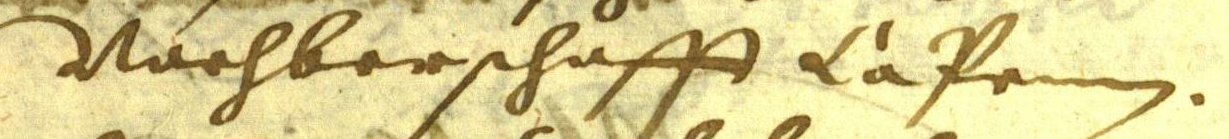Nachberschafft CaPenn.
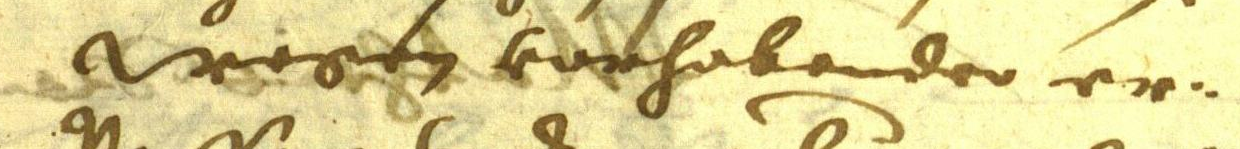wegen vorhabender er¬
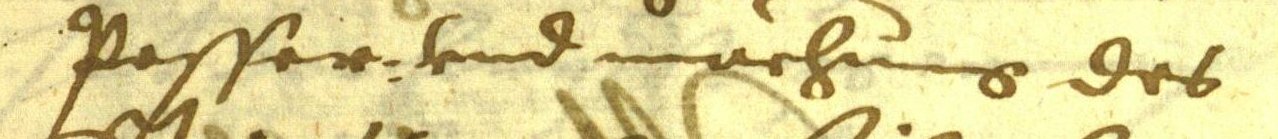Pesser: vnd machūng des
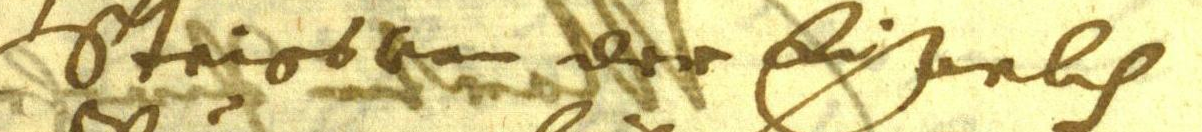Steigs von der Eisackh
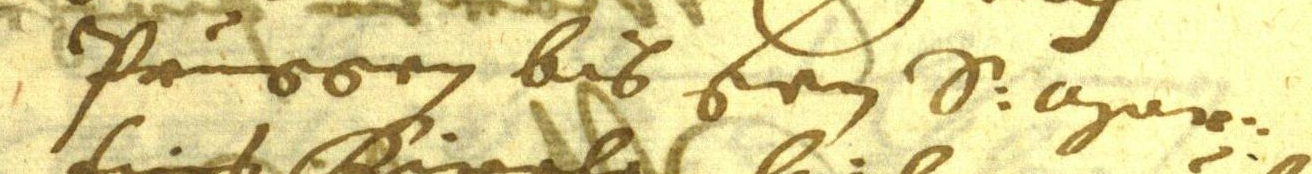Prūggen bis gen S: Mar¬
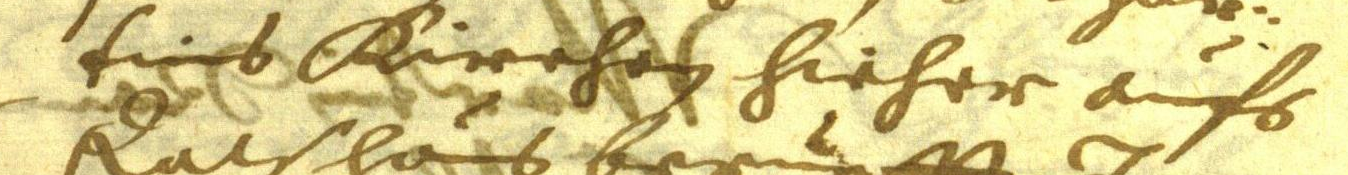tins Kirchen hieher aūfs
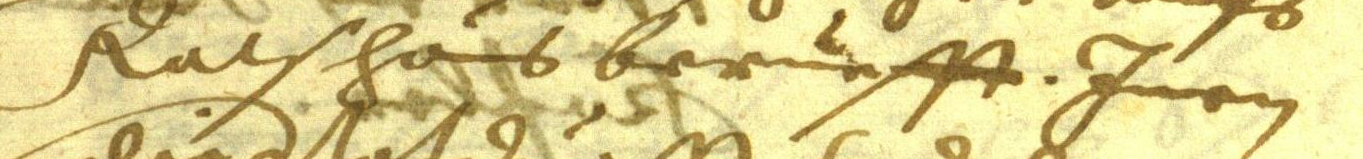Ratshaūs berūefft. Inen
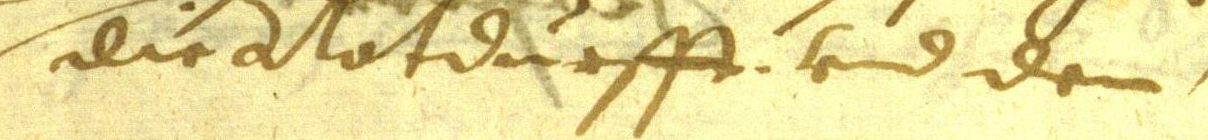die Notdūrfft. vnd den
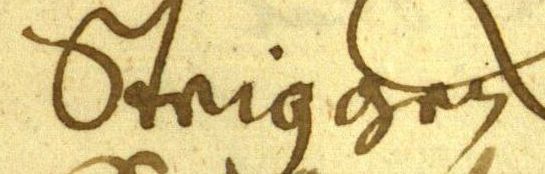Steig gen
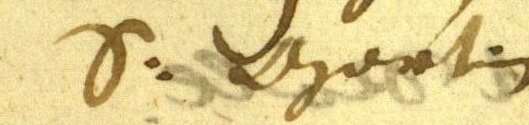S: Martin
